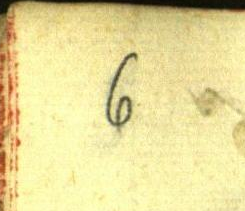6
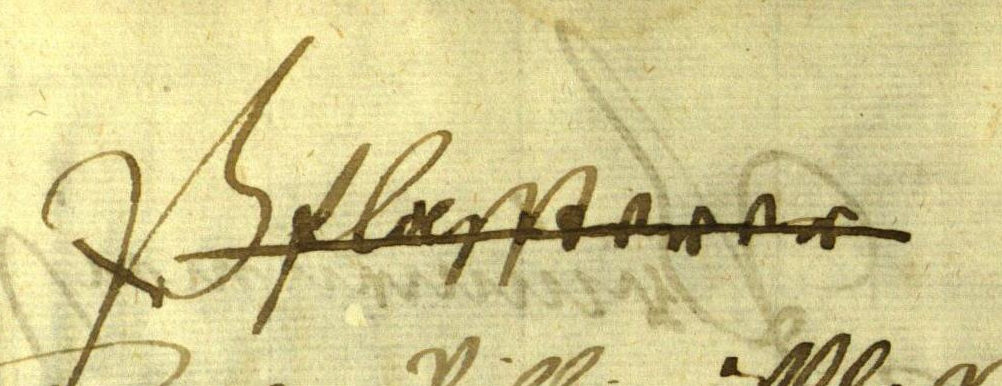Pflassterer
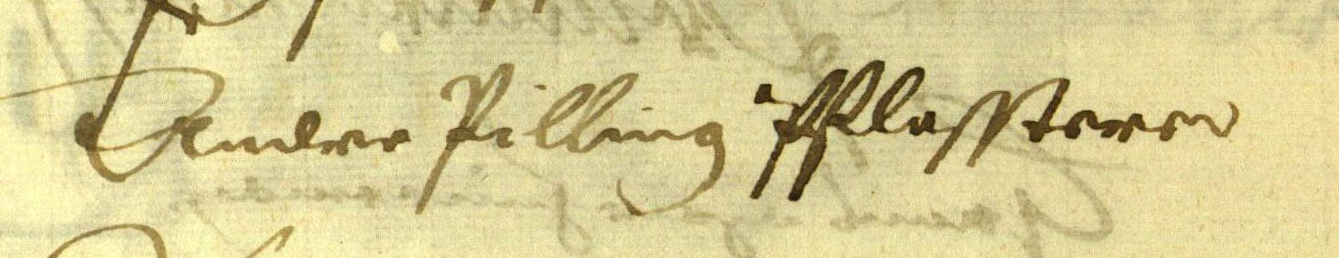Andre Pilling Pflassterer
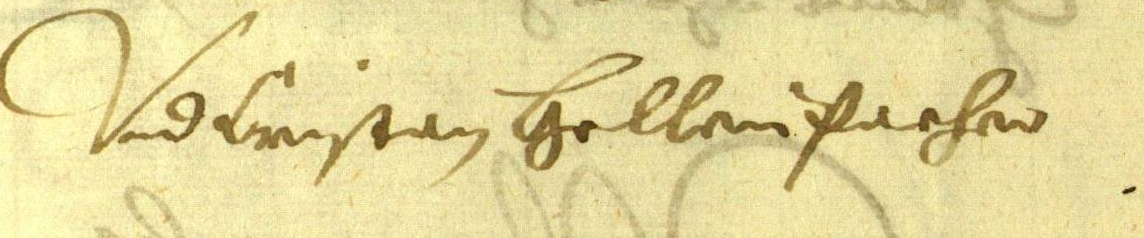Vnd Cristan Hellenpacher
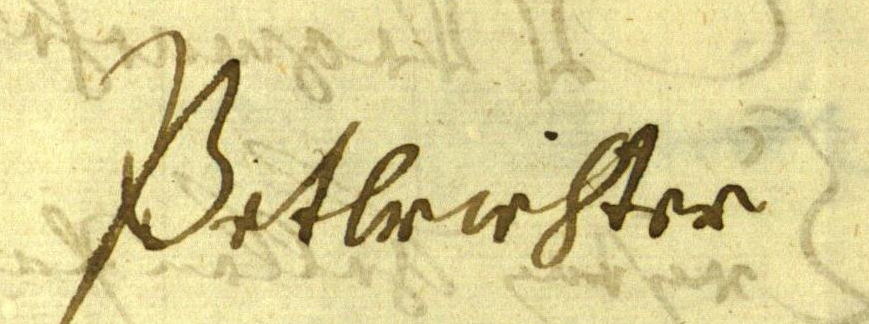Petlrichter
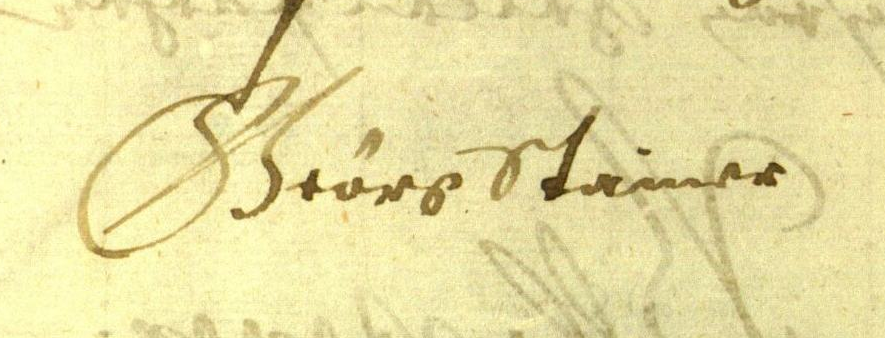Geörg Stainer
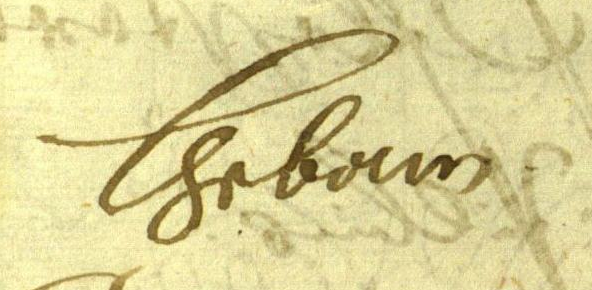Hebam
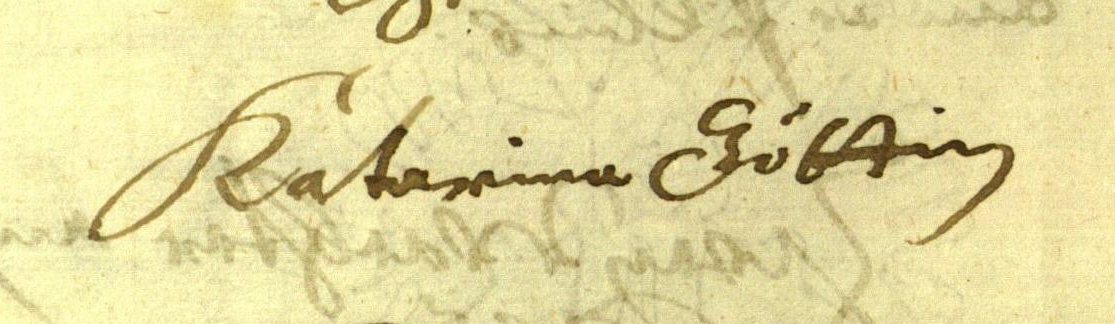Katarina Gōttin
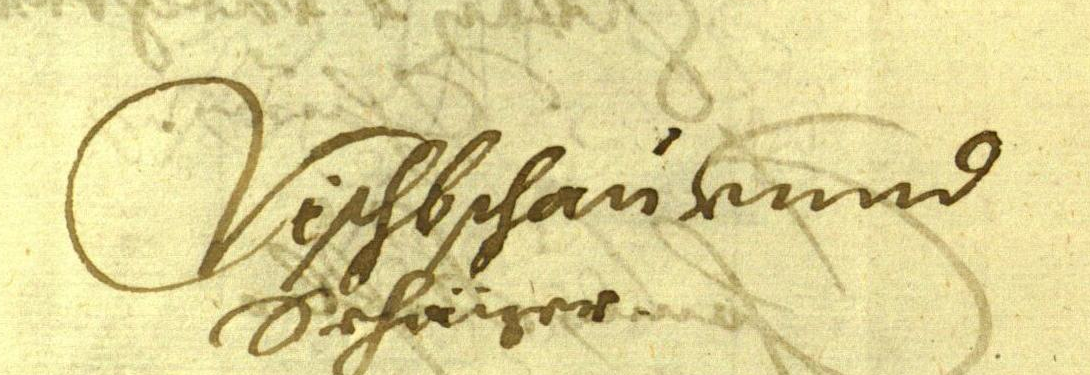Vischbschaū vnnd
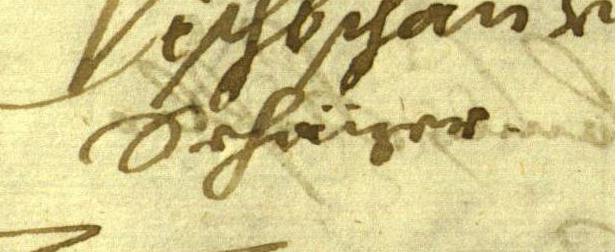Schäzer
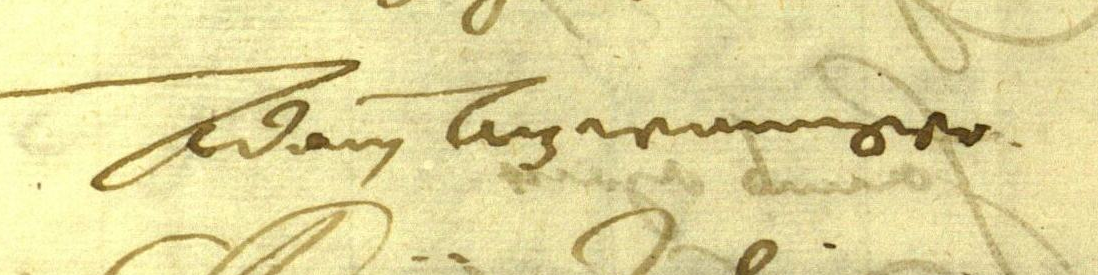Adam Azwannger
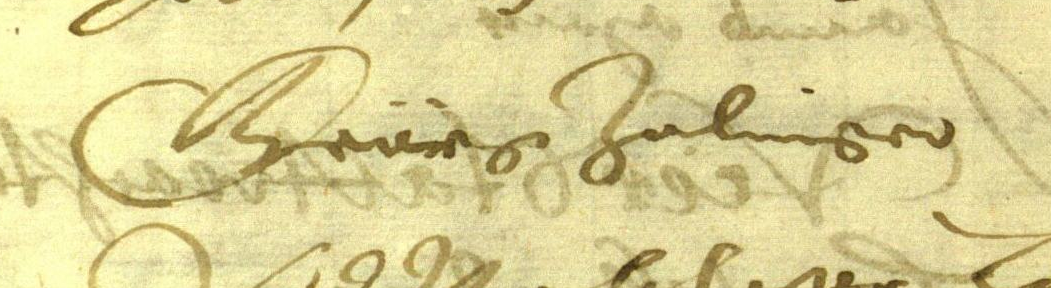Geörg Zalinger
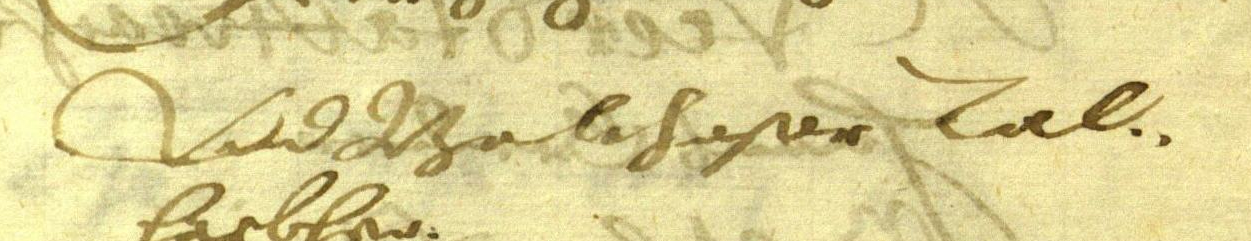Vnd Balthasar Tal¬
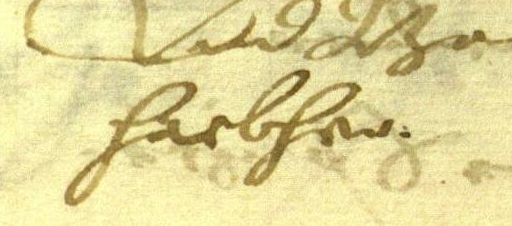hackher.
